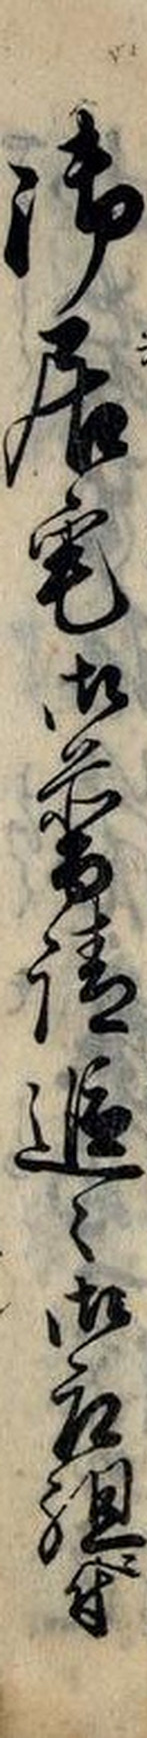御居宅御普請追々御取組に付
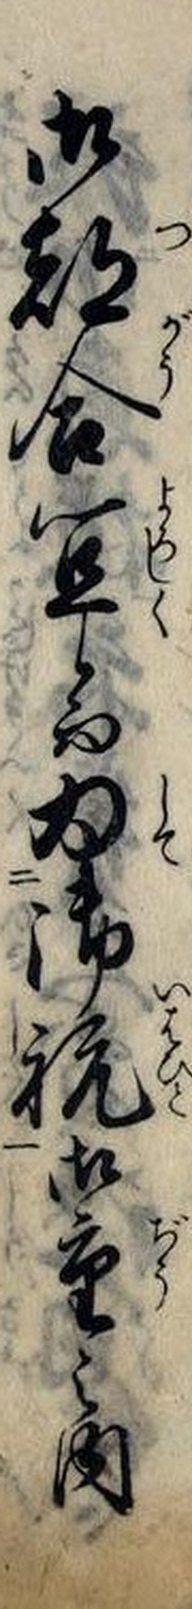御都合宜候而為御祝御重之内

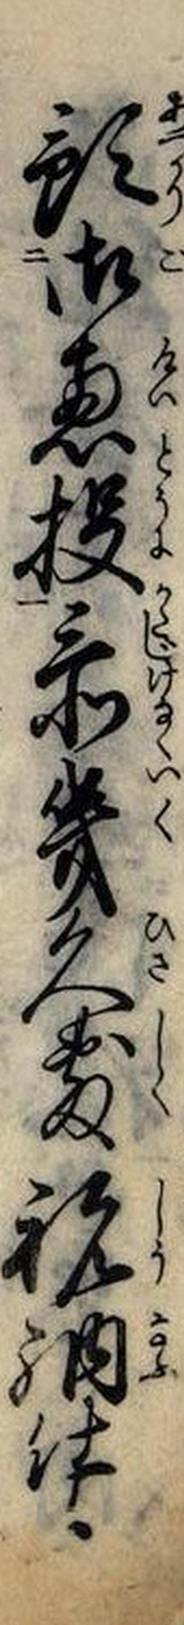預御恵投忝幾久敷祝納仕候
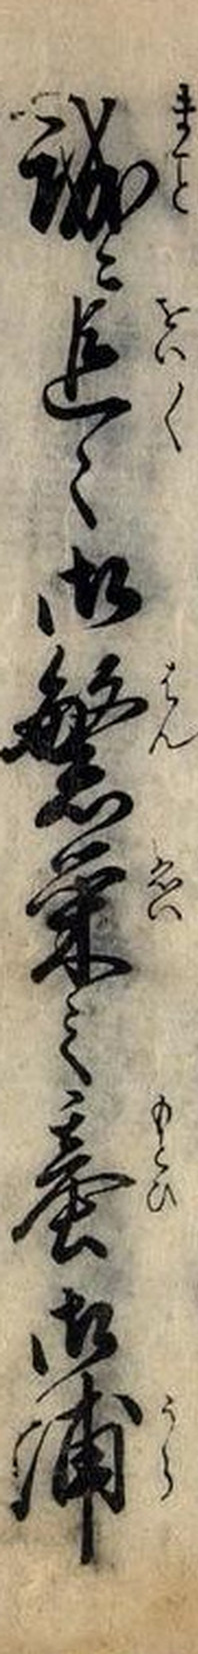誠に追々御繁栄之基御浦
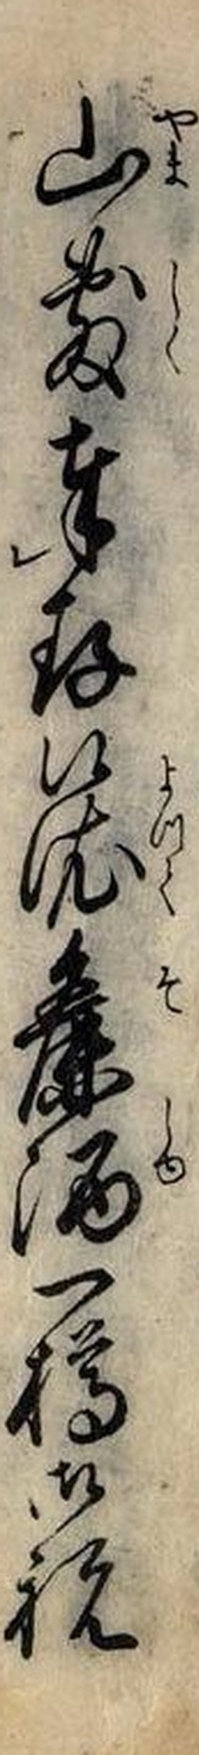山敷奉存候依麁酒一樽御祝
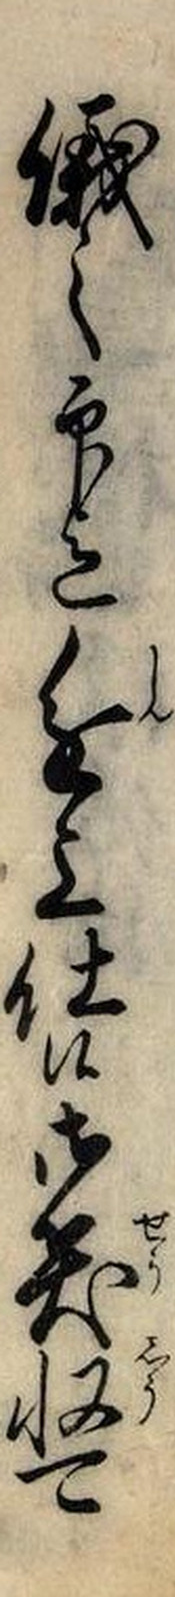儀之印迄進上仕候御笑収可
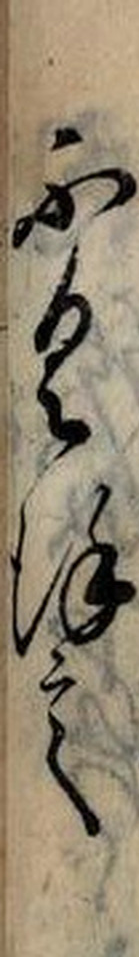不具謹言
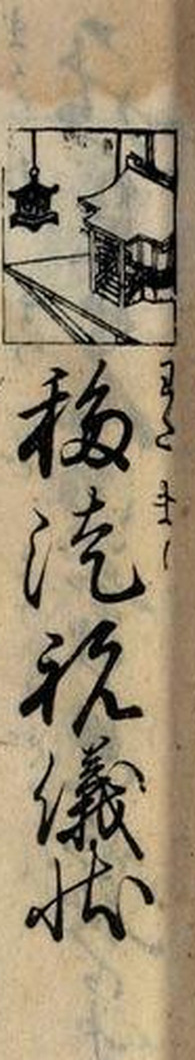移徙祝儀状
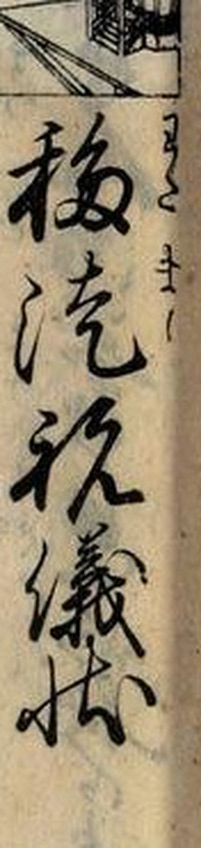移徙祝儀状
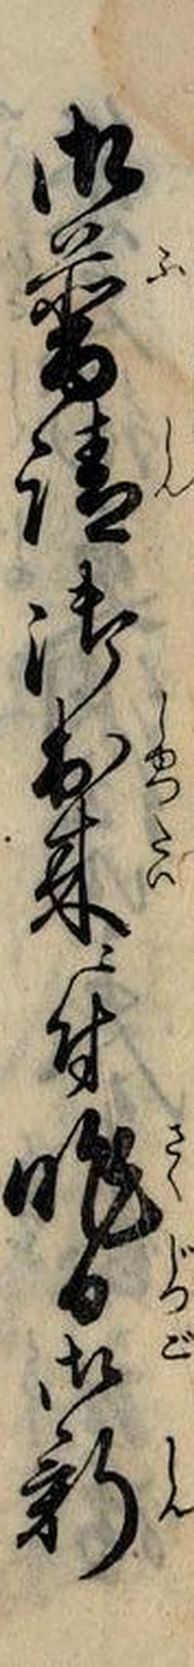御普請御出来に付昨日御新
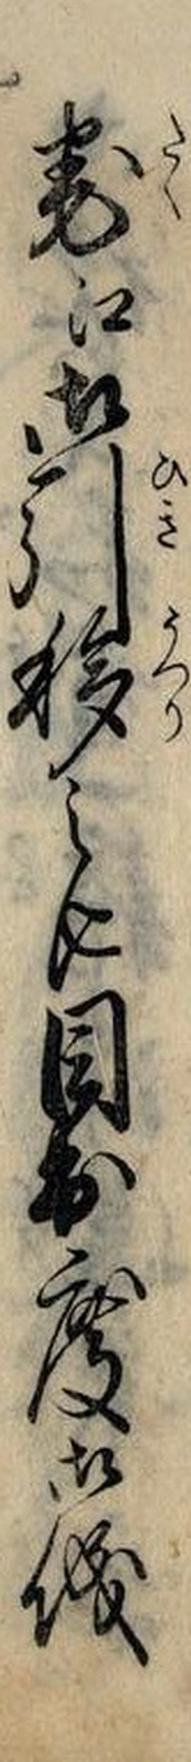宅江御引移之由目出度御儀
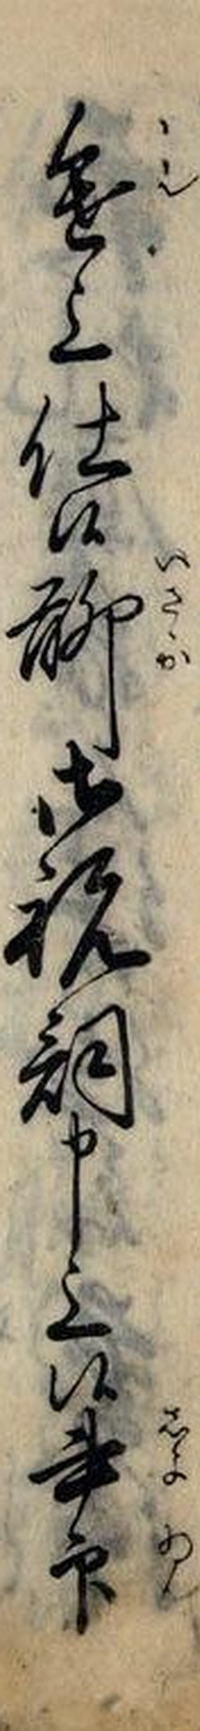進上仕候聊御祝詞申上候書印
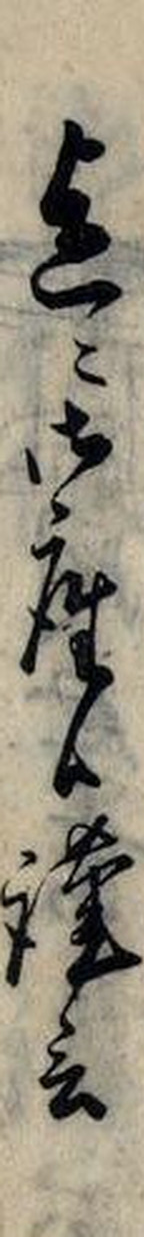迄に御座候謹言

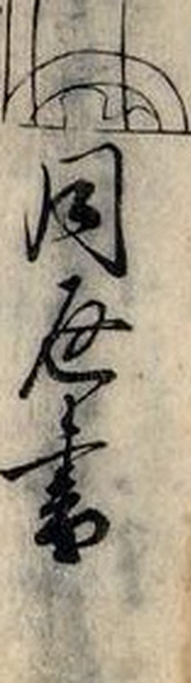同返書
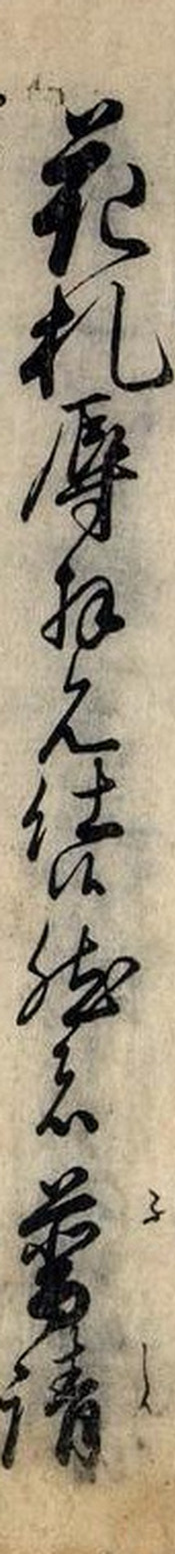花札辱拝見仕候然者普請
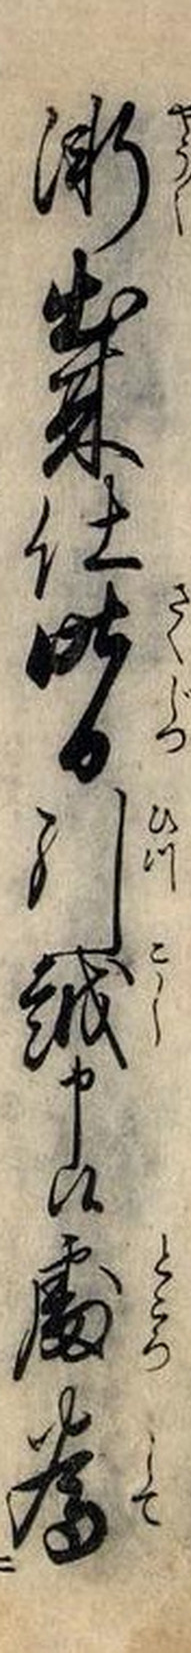漸出来仕昨日引越申候處為
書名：大成用文章（往来物）
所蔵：福井県文書館 Fukui Prefectural Archives
